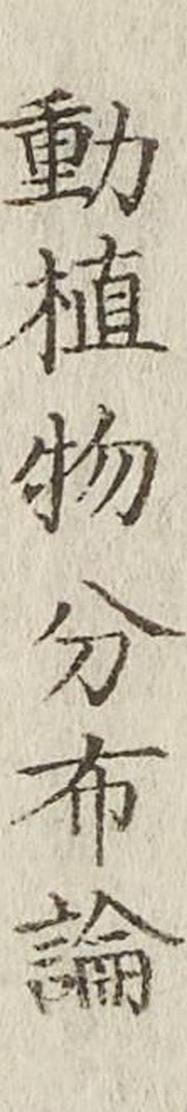動植物分布論
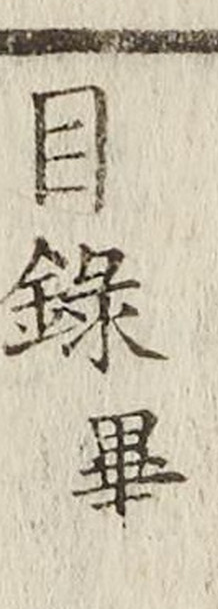目録畢
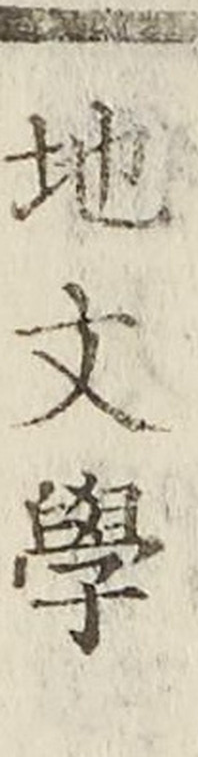地文学
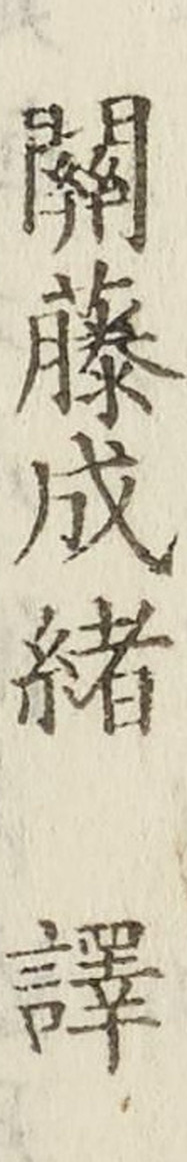関藤成緒訳
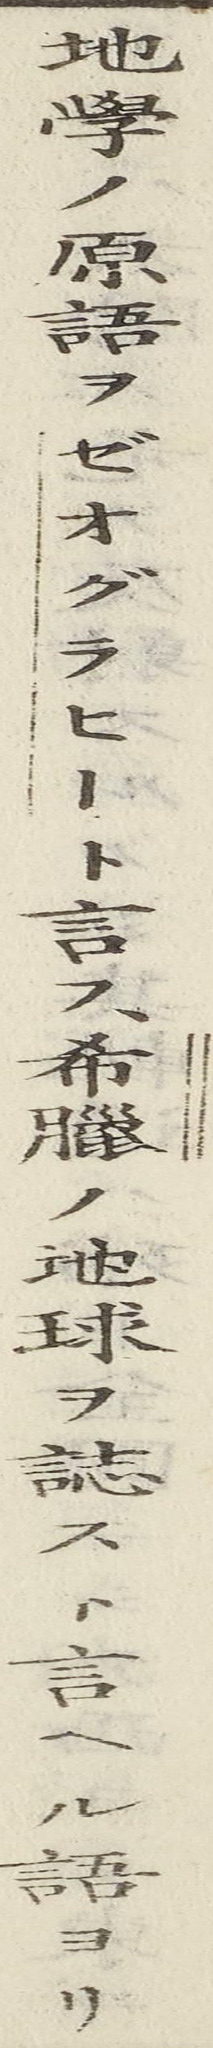地学ノ原語ヲゼオグラヒート言フ、希臘ノ地球ヲ誌スト？言ヘル語ヨリ
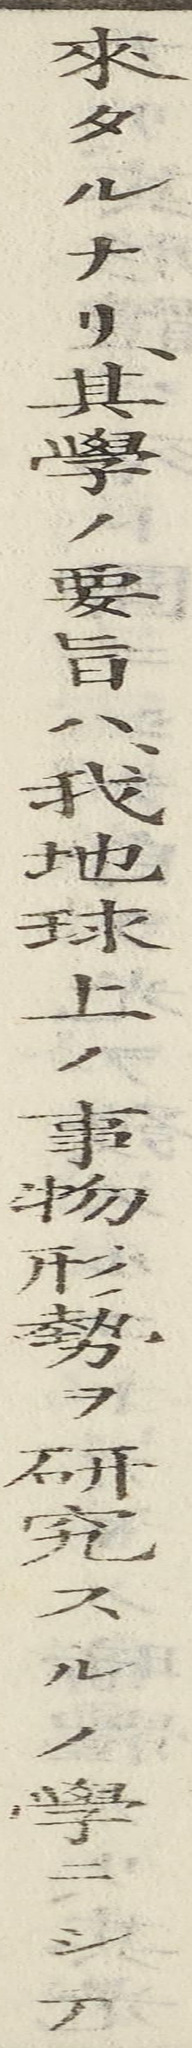来タルナリ、其学ノ要旨ハ、我地球上ノ事物形勢ヲ研究スルノ学ニシテ
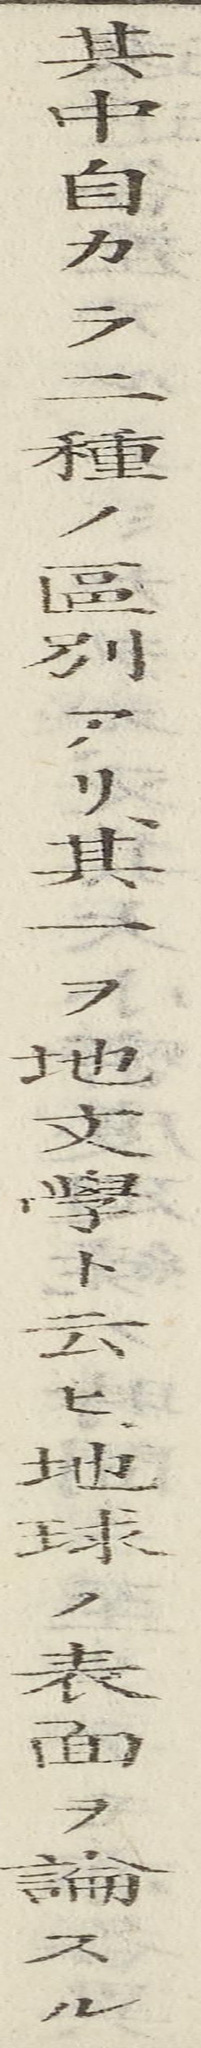其中自カラ二種ノ区別アリ、其一ヲ地文学ト云ヒ地球ノ表面ヲ論スル
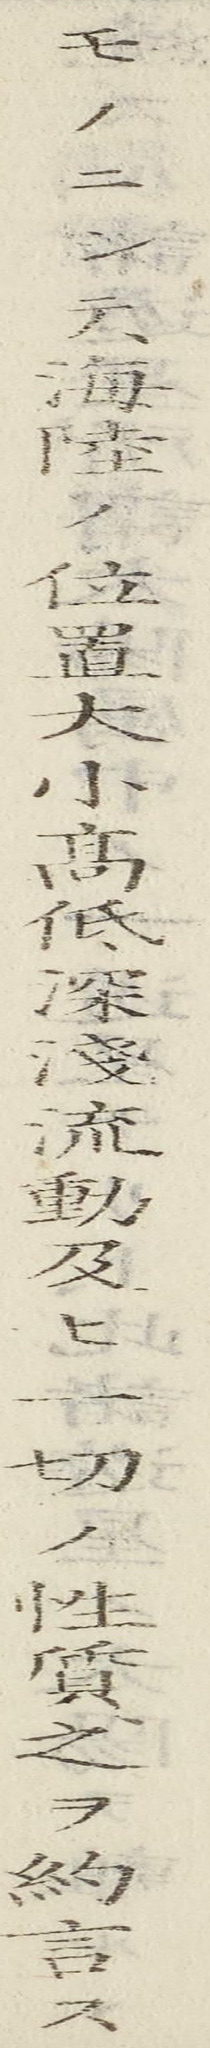モノニシテ、海陸ノ位置大小高低深浅流動及ヒ一切ノ性質、之ヲ約言ス
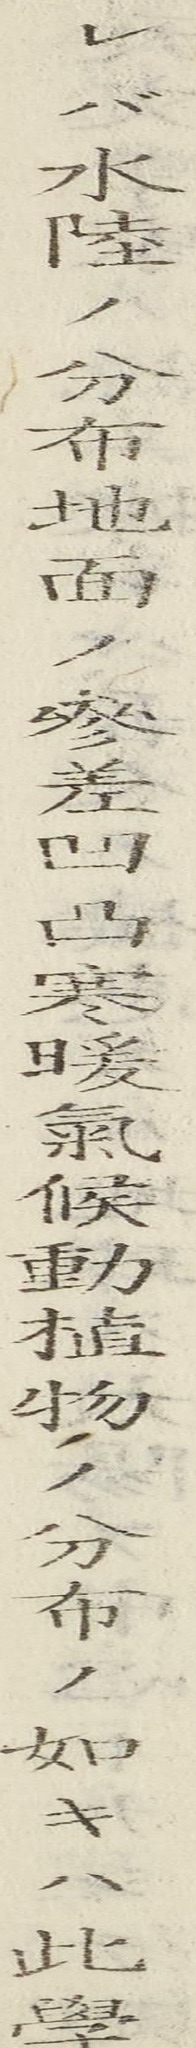レバ水陸ノ分布地面ノ参差凹凸寒暖気候動植物ノ分布ノ如キハ此学
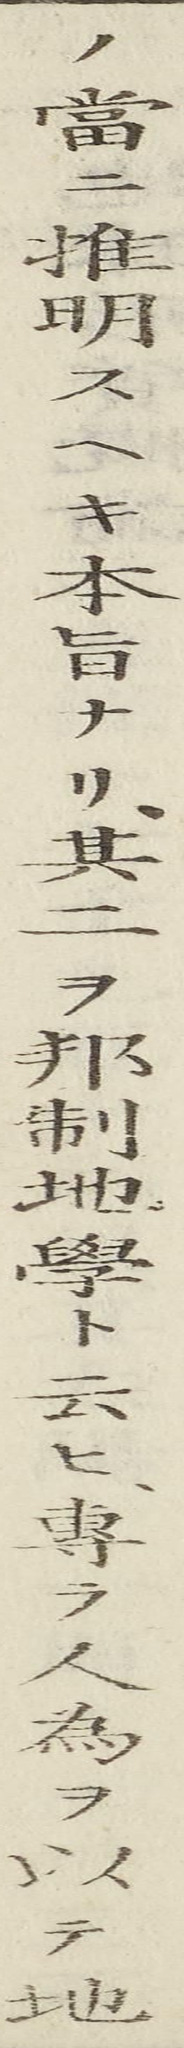ノ当ニ推明スヘキ本旨ナリ、其二ヲ邦制地学ト云ヒ、専ラ人為ヲ以テ地
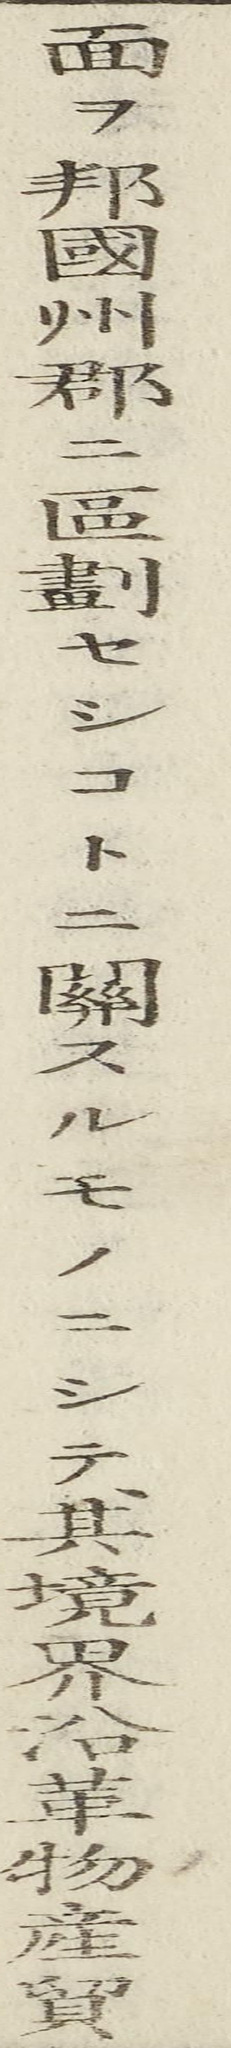面ヲ邦国州郡ニ区画セシコトニ関スルモノニシテ、其境界沿革物産貿
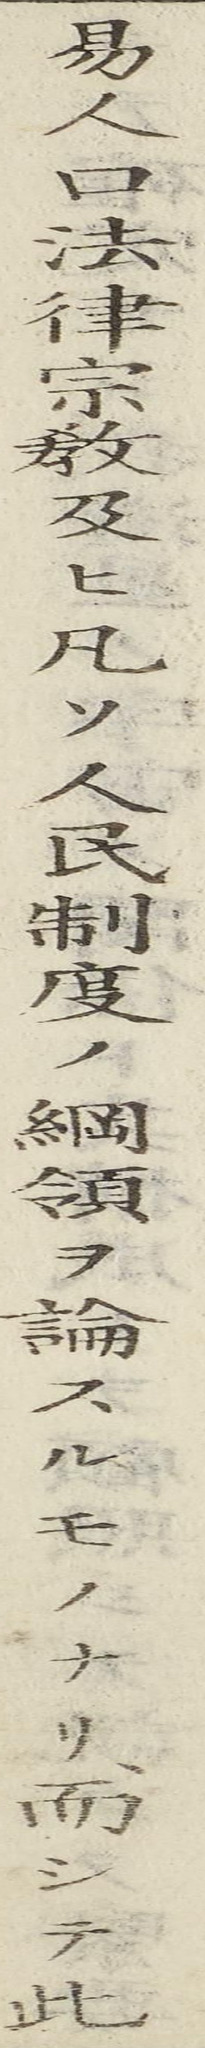易人口法律宗教及ヒ凡ソ人民制度ノ綱領ヲ論スルモノナリ、而シテ此
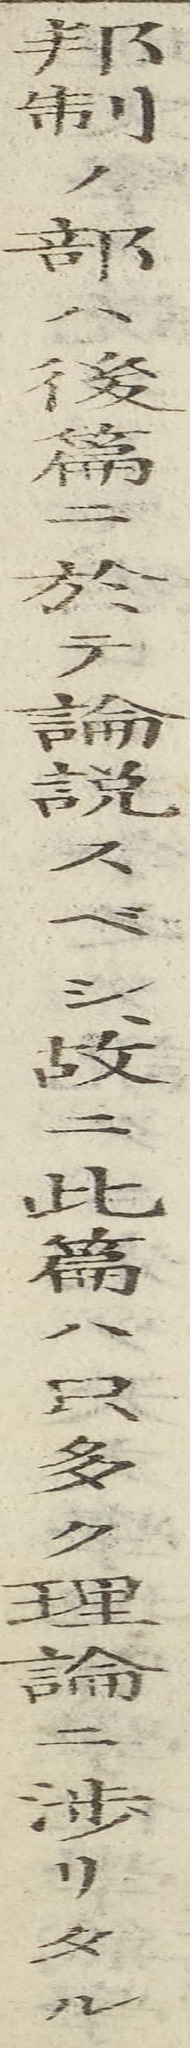邦制ノ部ハ後篇ニ於テ論説スベシ、故ニ此篇ハ只多ク理論ニ渉リタル

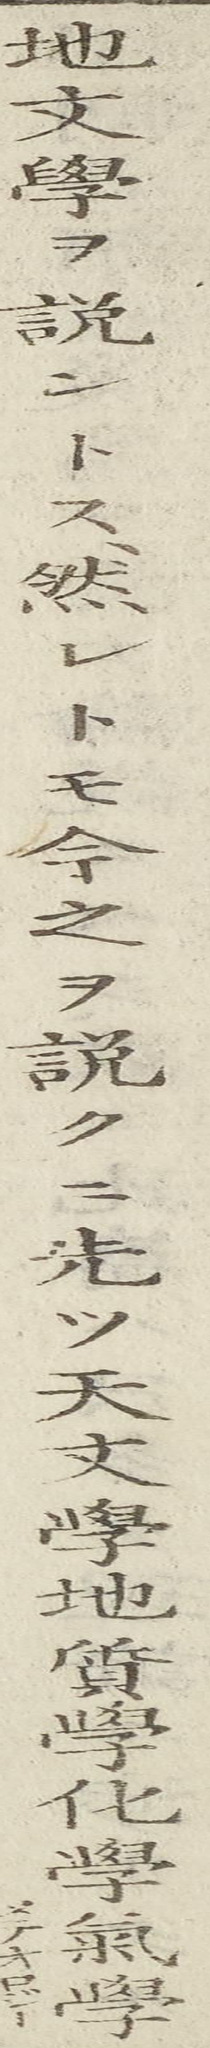地文学ヲ説ントス、然レトモ今之ヲ説クニ先ツ天文学地質学化学気学
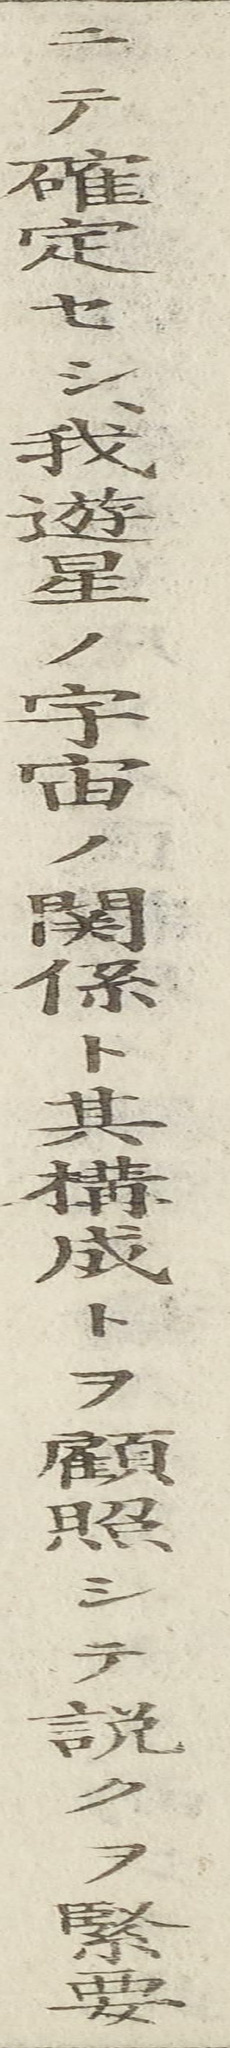ニテ確定セシ、我遊星ノ宇宙ノ関係ト其構成トヲ顧照シテ説クヲ緊要
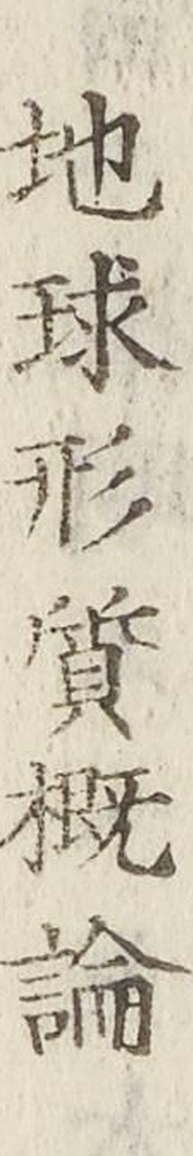地球形質概論
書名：百科全書　地文學　全
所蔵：東京大学地震研究所図書室 Earthquake Research Institute Library, The University of Tokyo, JAPAN
